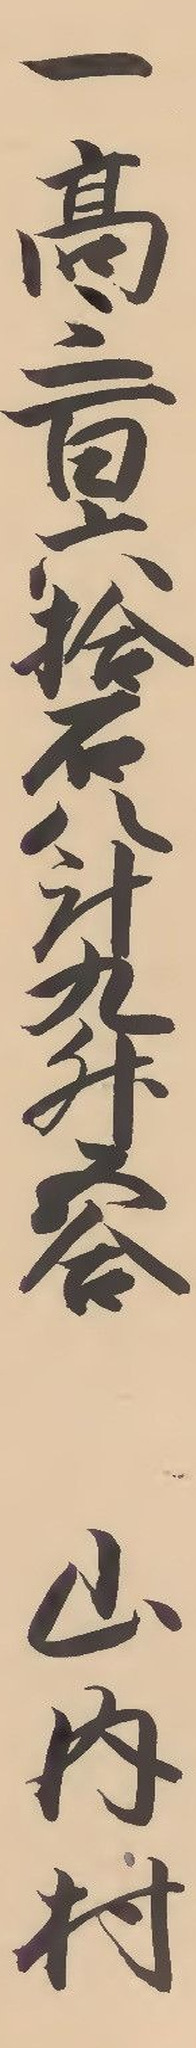一高三百六拾石八斗九升五合山内村

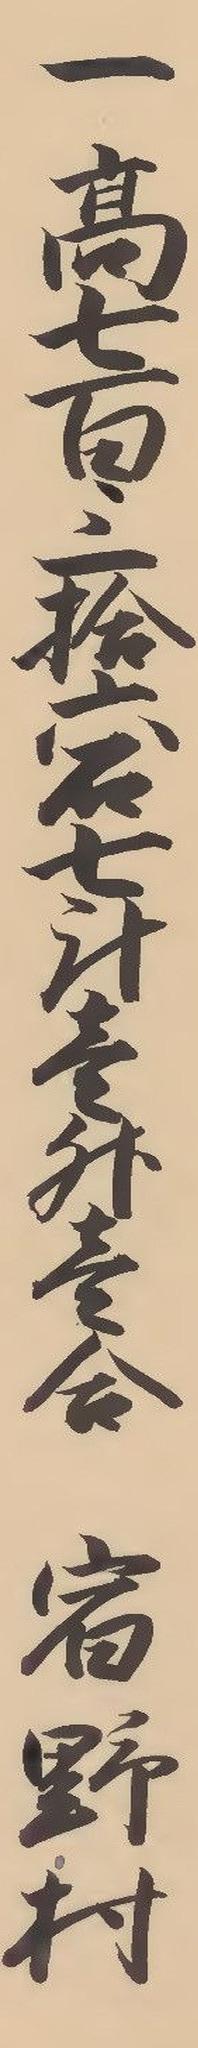一高七百三拾六石七斗壱升壱合宿野村
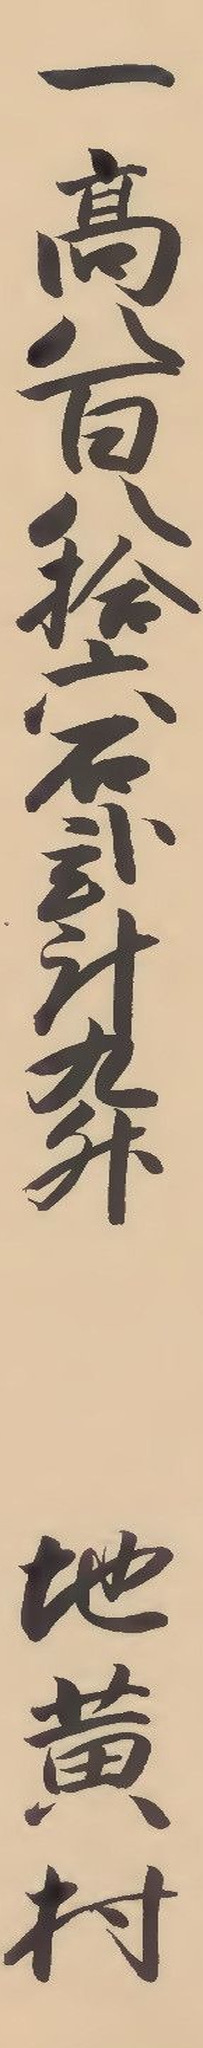一高八百八拾六石弐斗九升地黄村
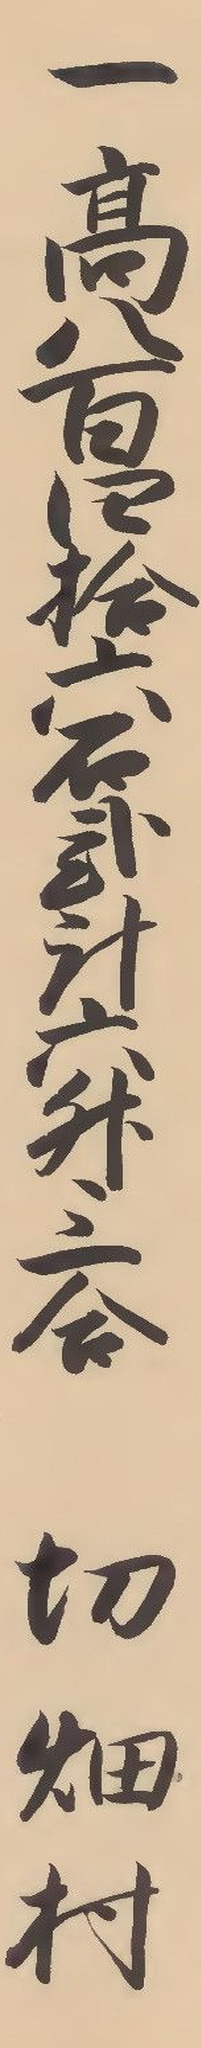一高八百四拾六石弐斗六升三合切畑村
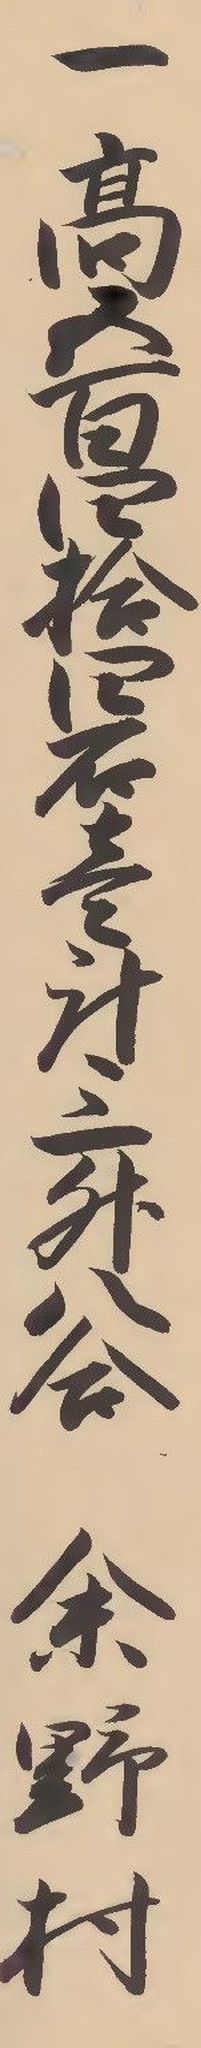一高五百四拾四石壱斗三升八合余野村
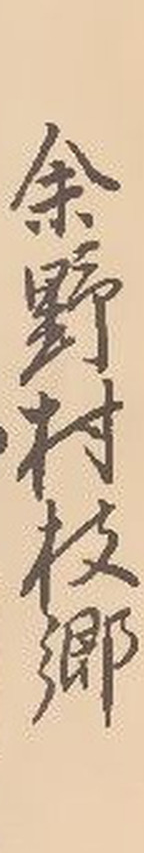余野村枝郷
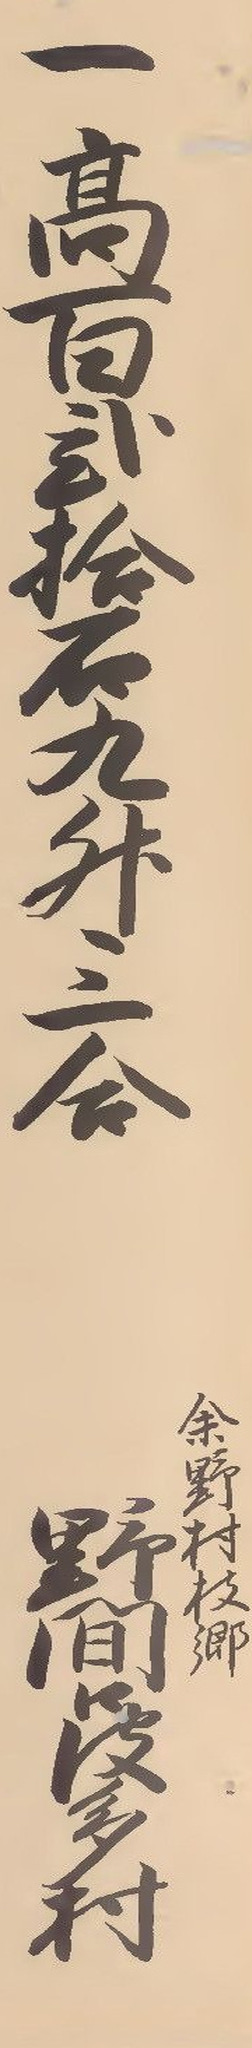一高百弐拾石九升三合野間口皮多村
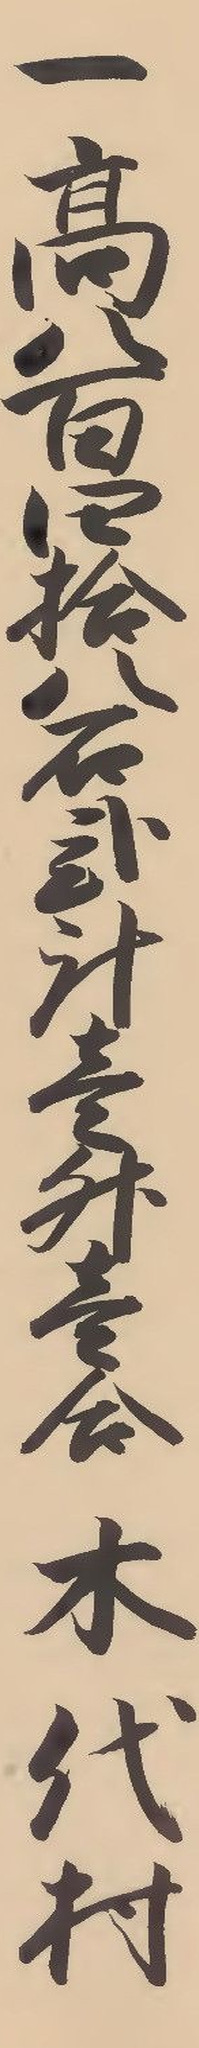一高八百四拾八石弐斗壱升壱合木代村
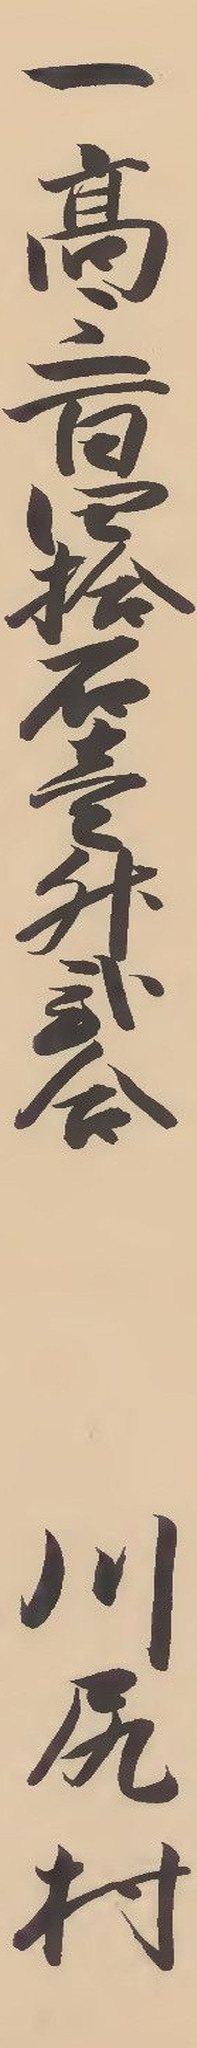一高三百四拾石壱升弐合川尻村
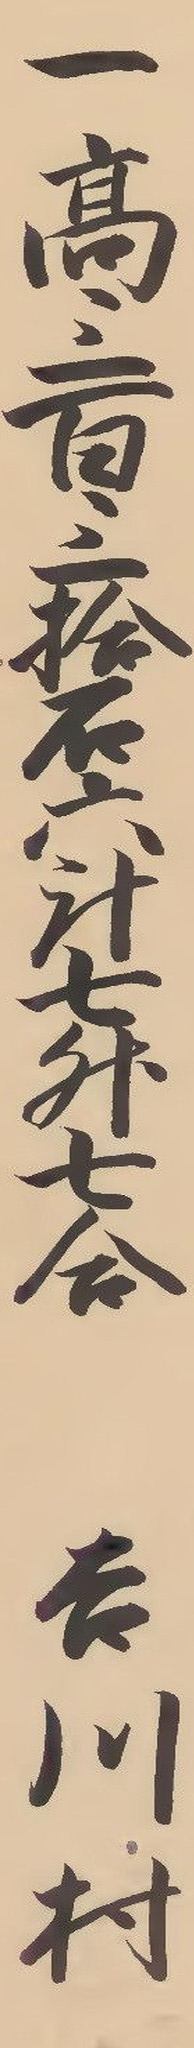一高三百三拾石六斗七升七合吉川村

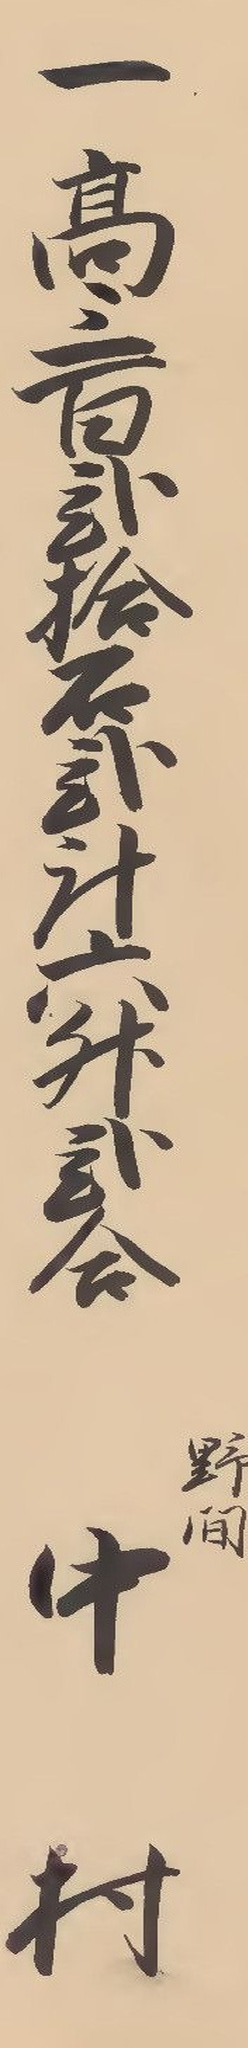一高三百弐拾石弐斗六升弐合中村
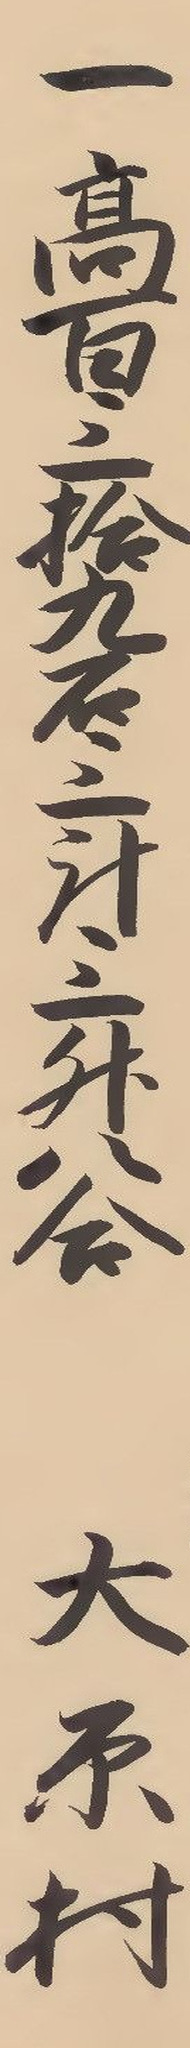一高百三拾九石三斗三升八合大原村
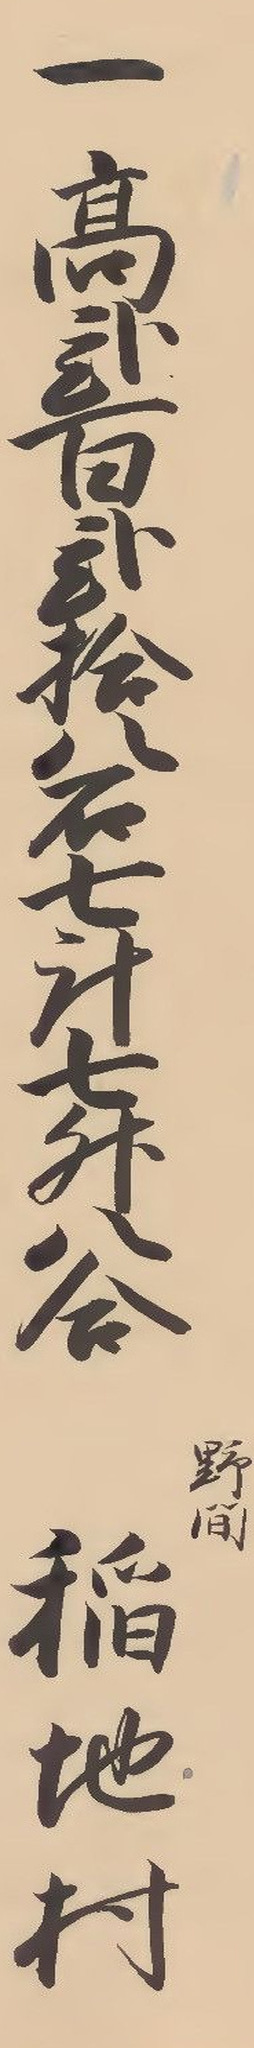一高弐百弐拾八石七斗七升八合稲地村
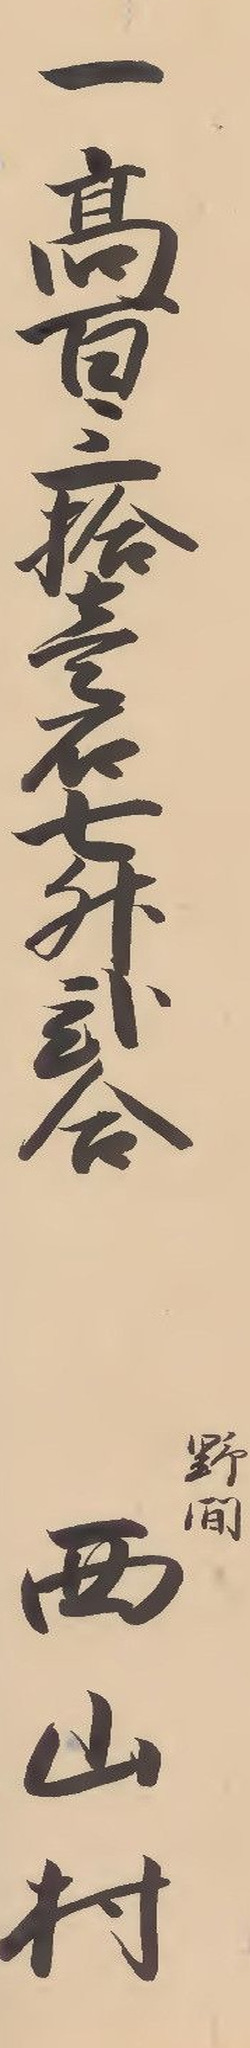一高百三拾壱石七升弐合西山村
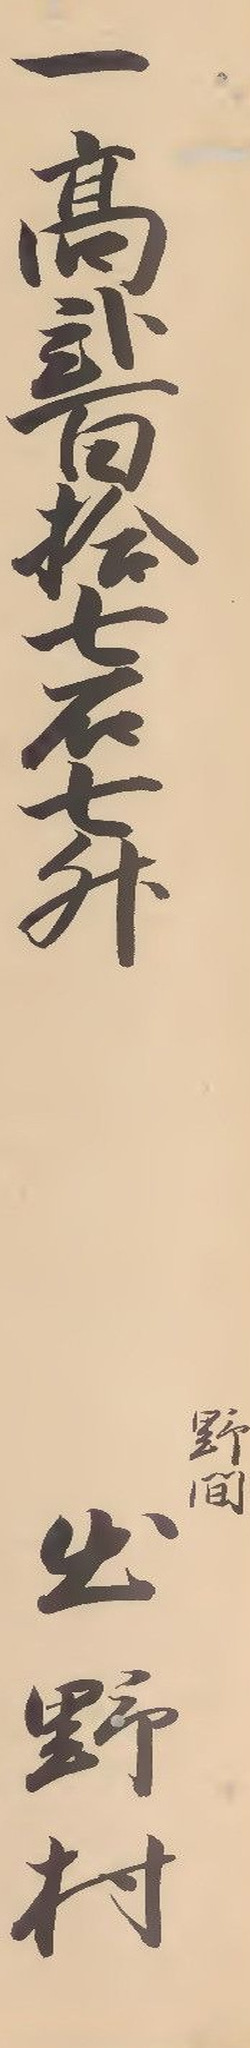一高弐百拾七石七升出野村
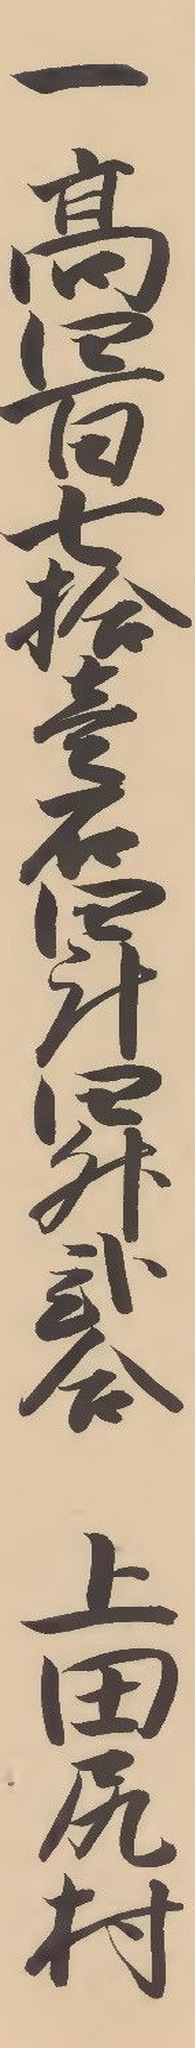一高四百七拾壱石四斗四升弐合上田尻村
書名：摂津国郷帳
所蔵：国立公文書館 National Archives of Japan
